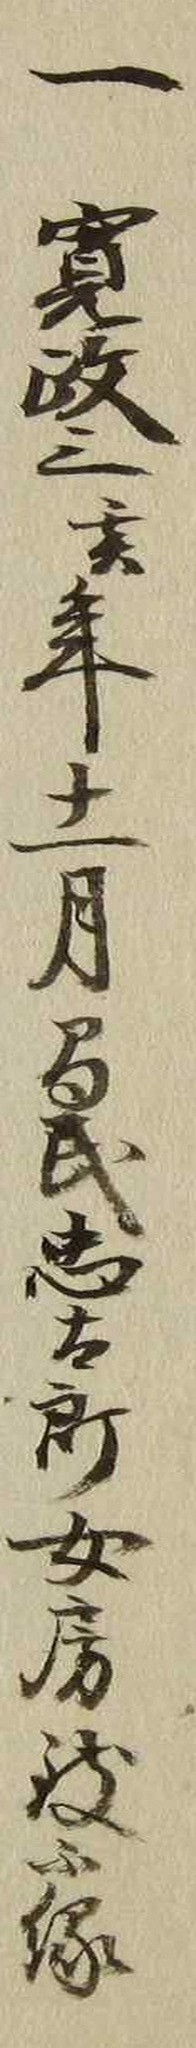一寛政三亥年十一月間民忠太郎女房致不縁
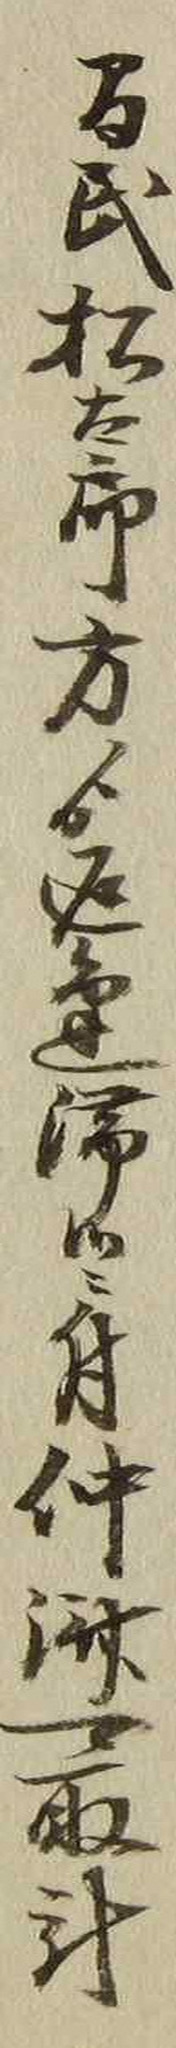間民松太郎方ゟ返金滞候ニ付仲済可取計
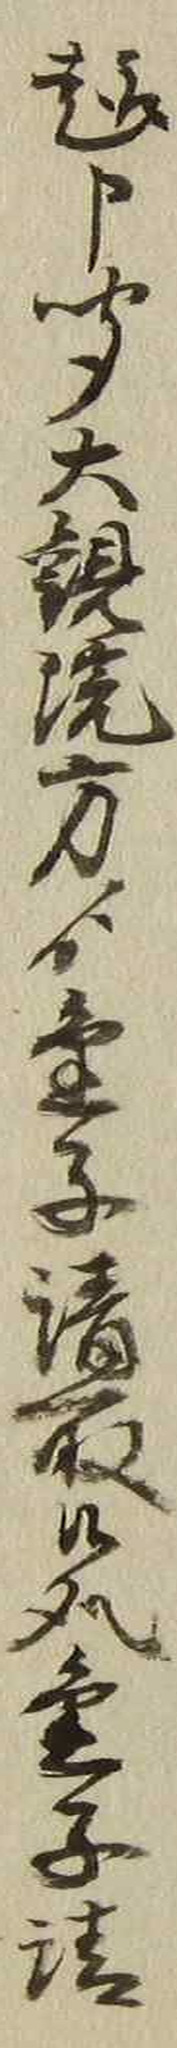趣申聞大観院方ゟ金子請取候候金子請
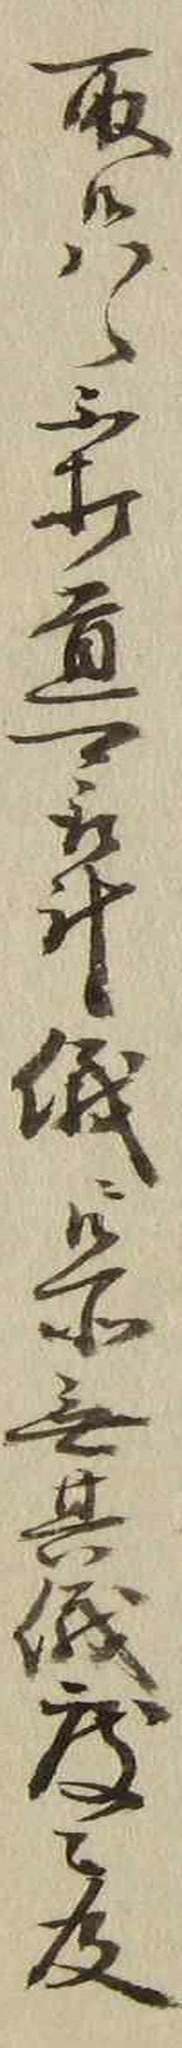取候ハヽ不打置可取計儀ニ候所無其儀度々及
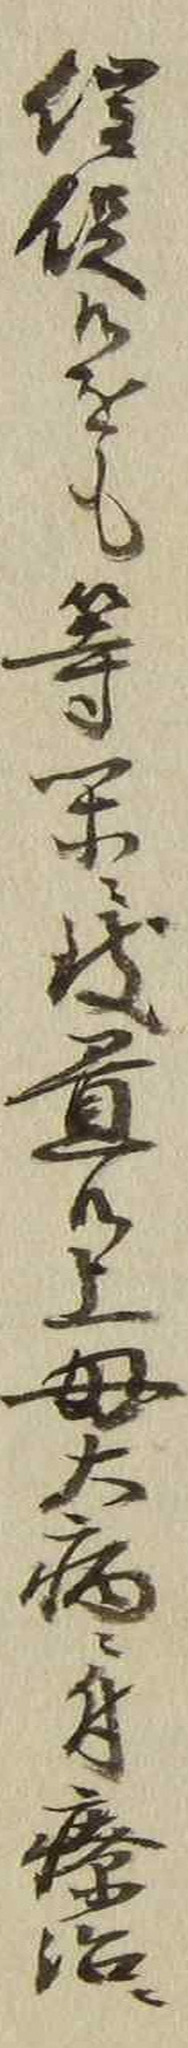催促候をも等閑ニ致置候上母大病ニ付療治ニ
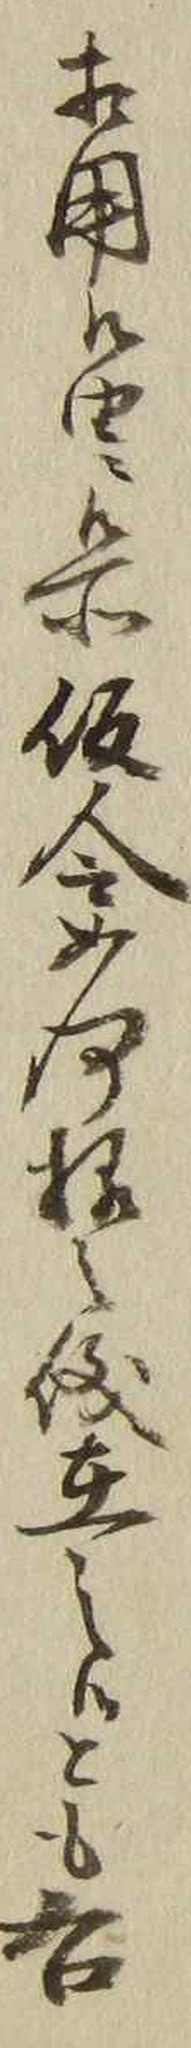相用候由ニ候所仮令如何様之儀在之候とも右
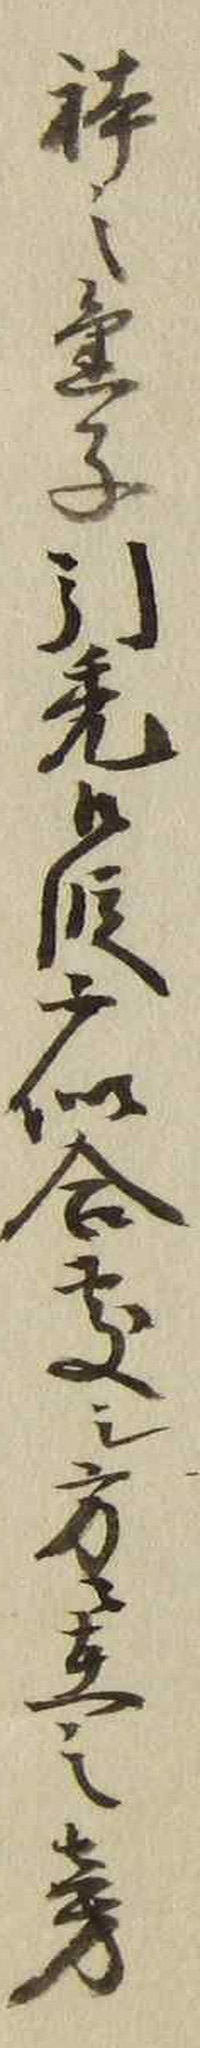躰之金子引禿候段不似合處シ方ニ在之旁

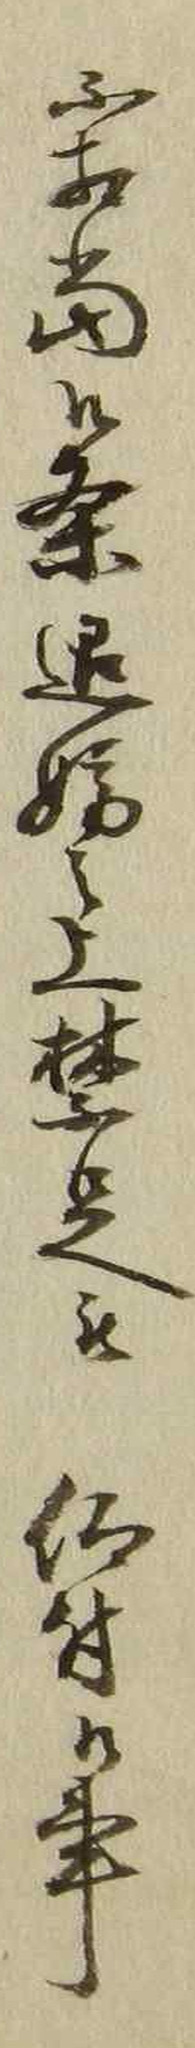不相当候条退嫡之上禁足被仰付候事
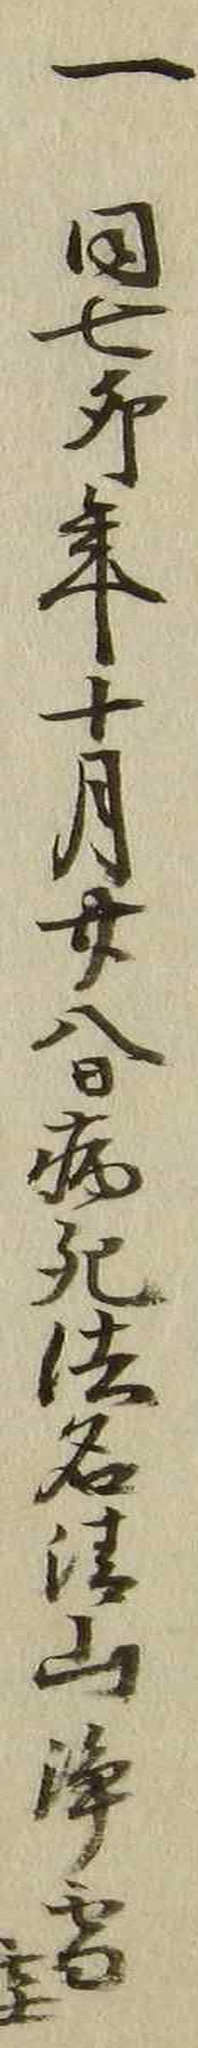一同七卯年十月廿八日病死法名清山浄雪
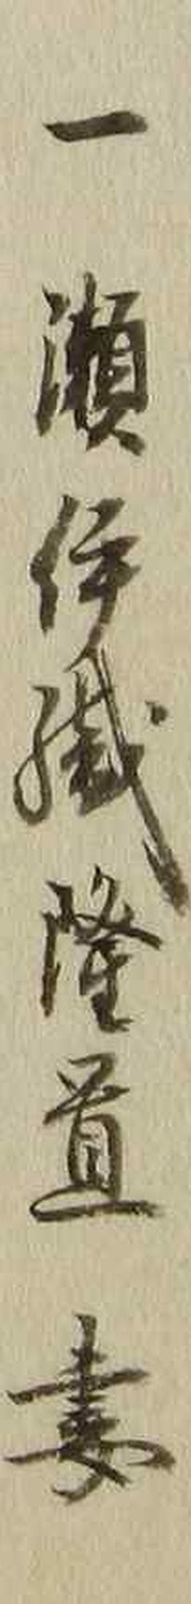一瀬伊織隆道妻
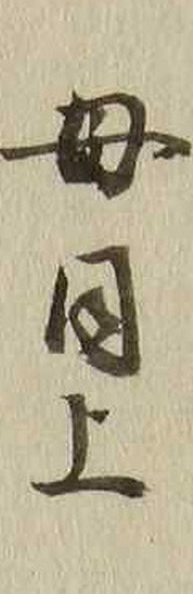母同上
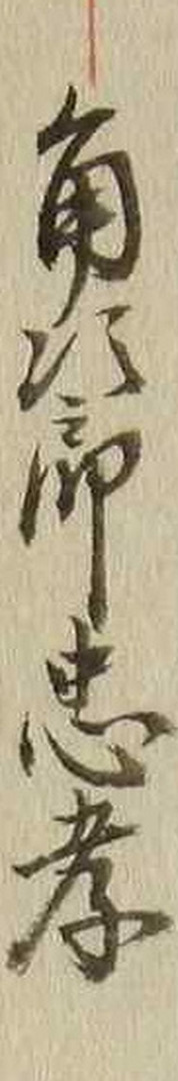角次郎忠孝
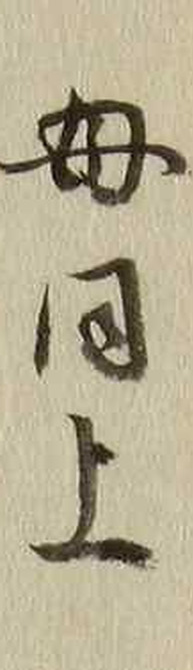母同上
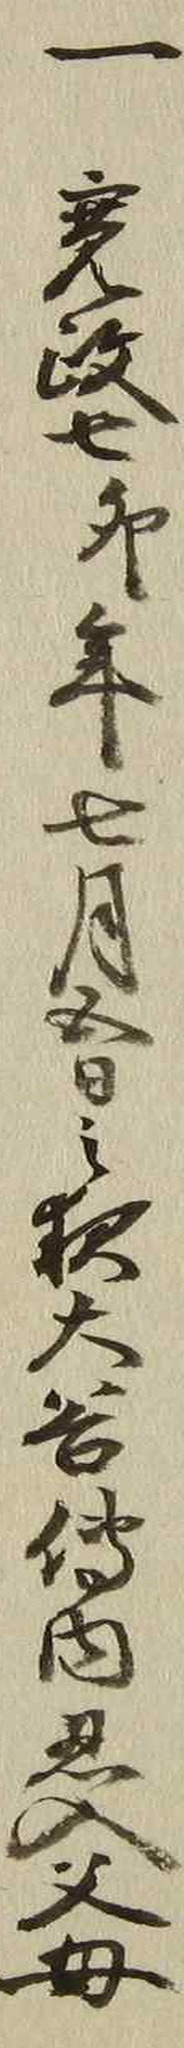一寛政七卯年七月五日之夜大谷傳内忍入父母
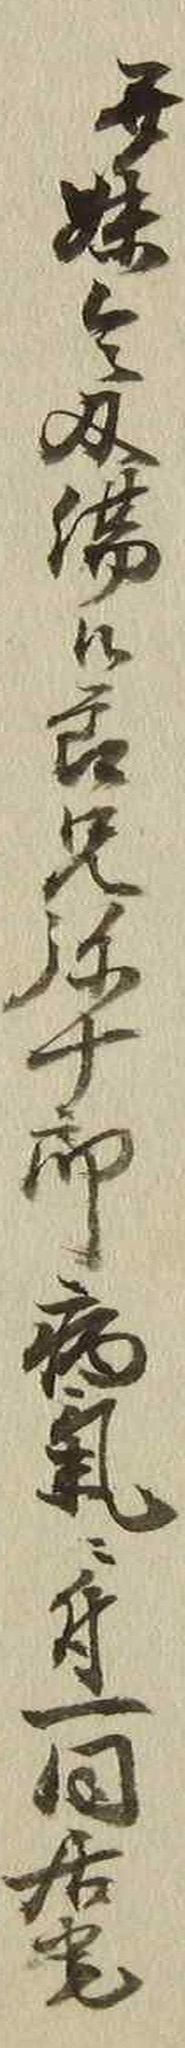幷妹今刃傷候節兄弥十郎病気ニ付一同居宅
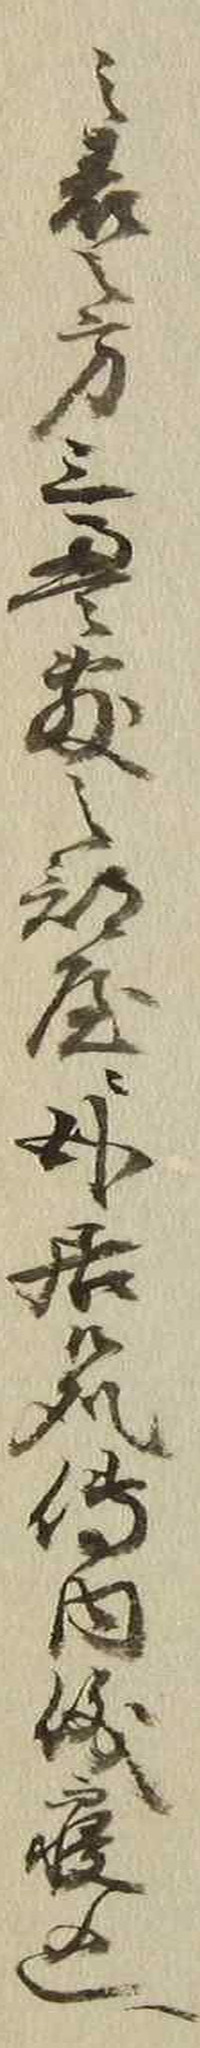之表之方三畳敷之部屋ニ臥居候処伝内儀寝込ヘ
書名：諸士系譜　巻之64　と之部7
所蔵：会津若松市立会津図書館
